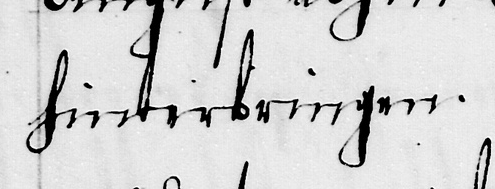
hinterbringen.
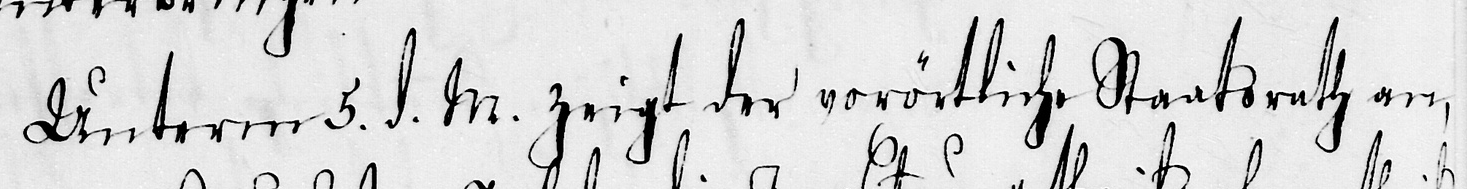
Unterm 5. d. M. zeigt der vorörtliche Staatsrath an,
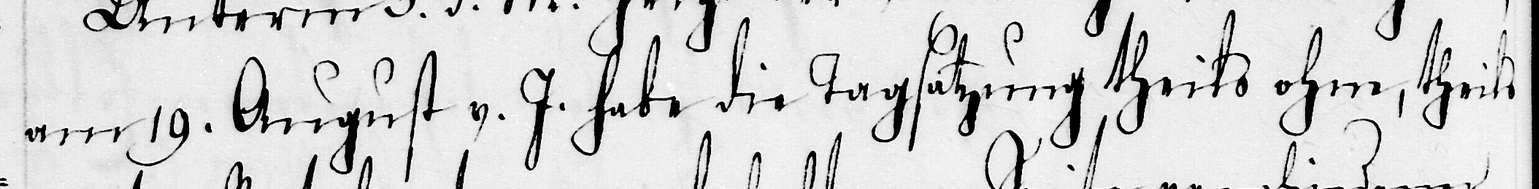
am 19. August v. J. habe die Tagsatzung theils ohne, theils
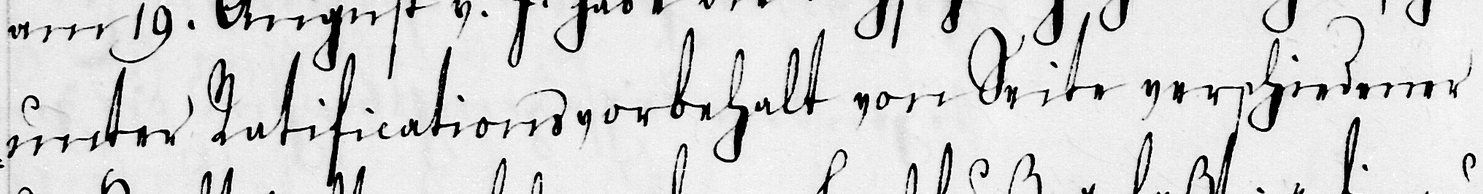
unter Ratificationsvorbehalt von Seite verschiedener
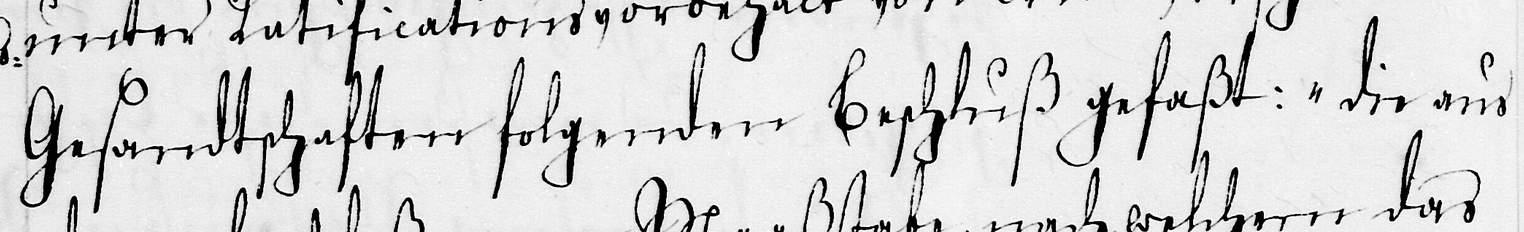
Gesandtschaften folgenden Beschluß gefaßt: „die aus
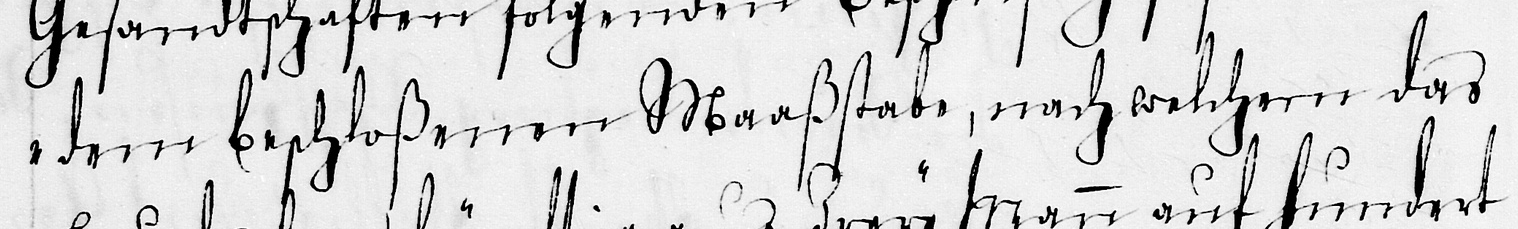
dem beschloßenen Maaßstabe, nach welchem das
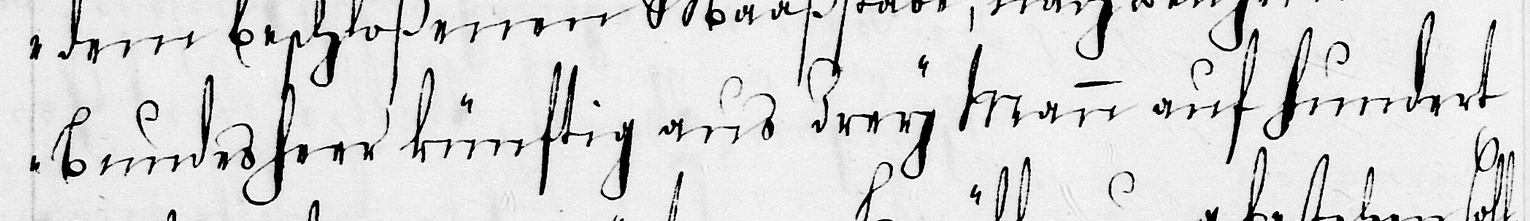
Bundesheer künftig aus drey Mann auf hundert
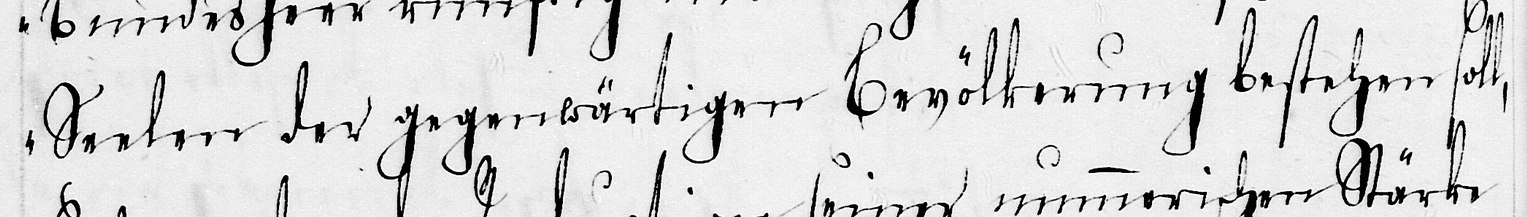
Seelen der gegenwärtigen Bevölkerung bestehen sol¬
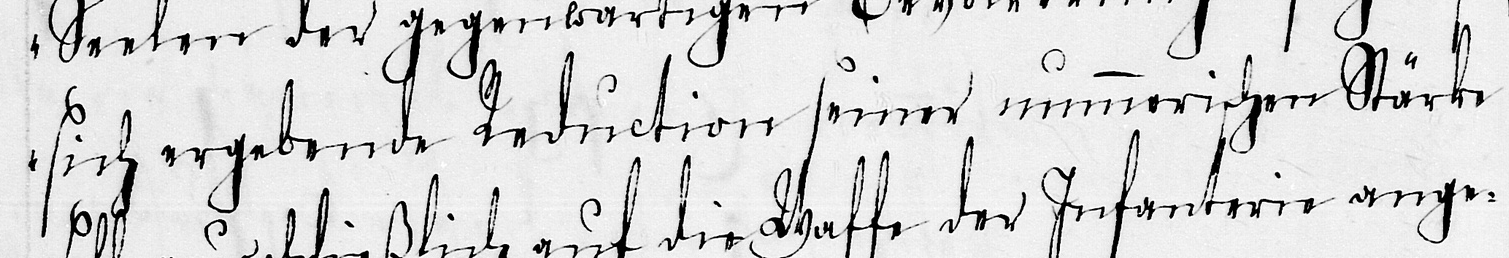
sich ergebende Reduction seiner nummerischen Stärke
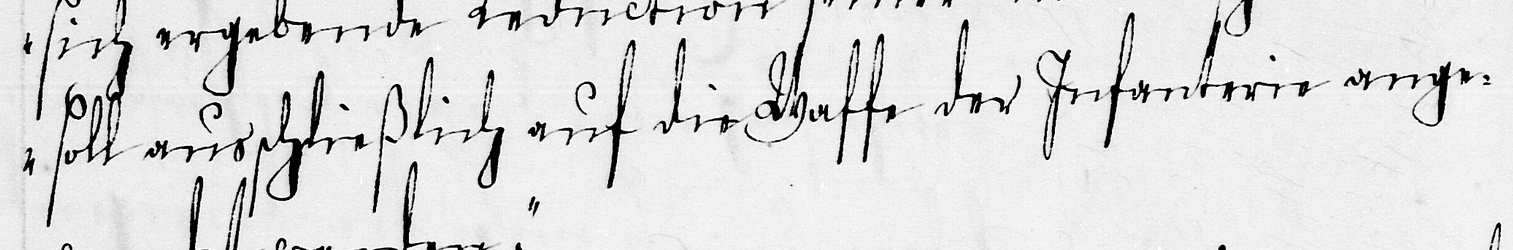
soll ausschließlich auf die Waffe der Infanterie ange¬
